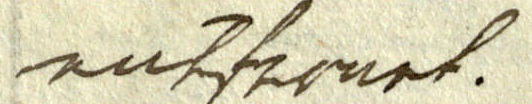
entfernet.
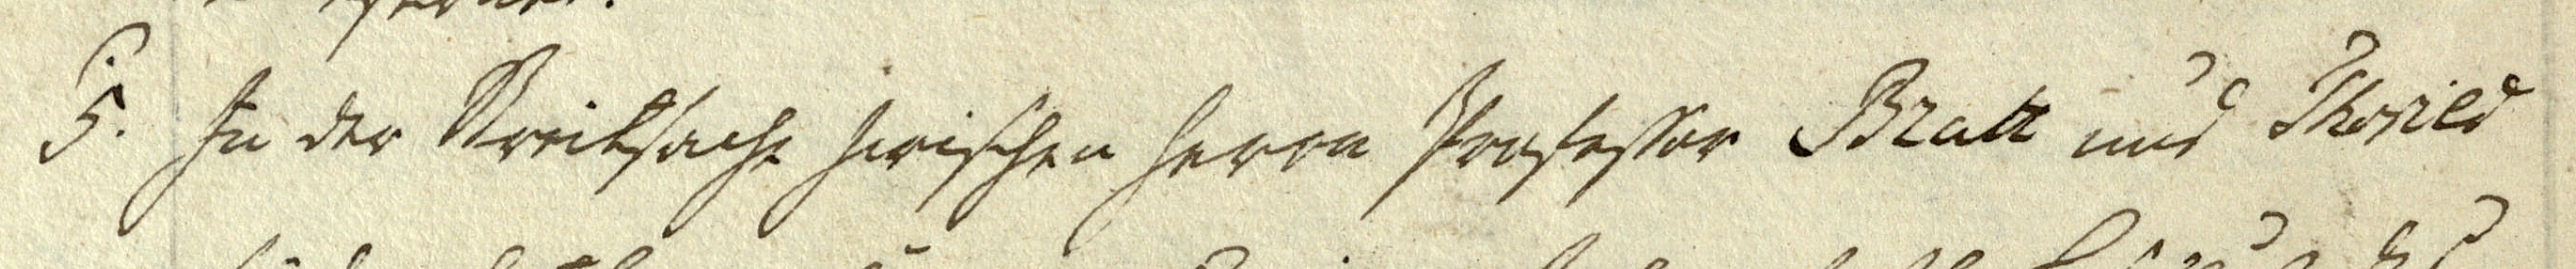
5. In der Streitsache zwischen Herrn Professor Bratt und Thorild
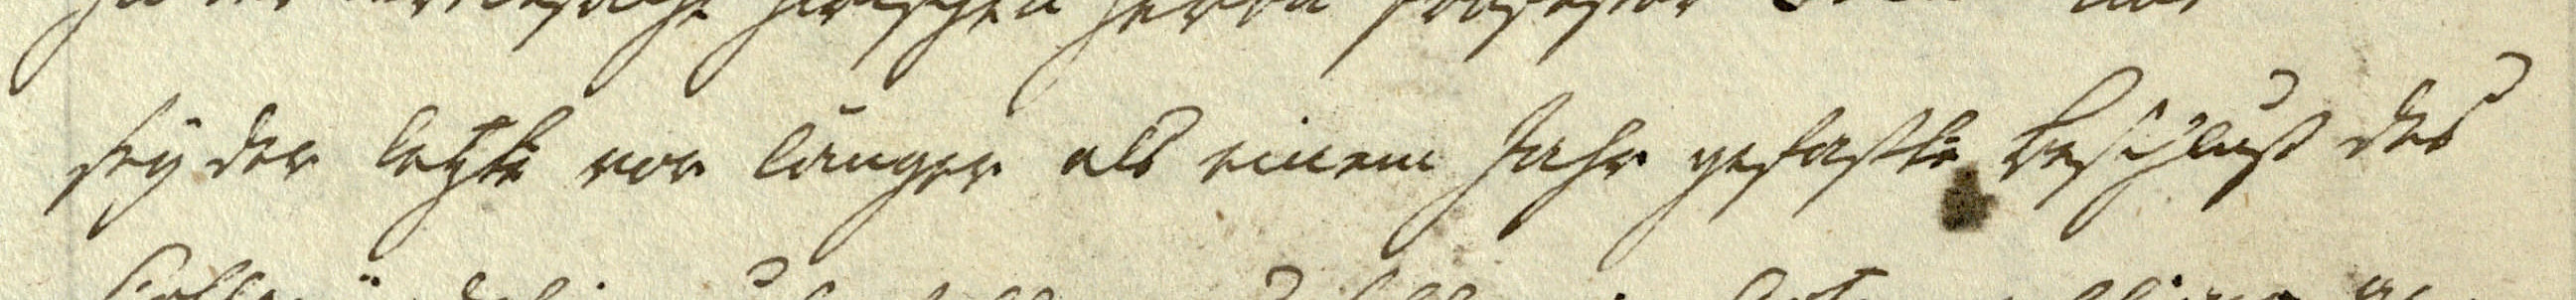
seÿ der letzte vor länger als einem Jahr gefaßte Beschluß des
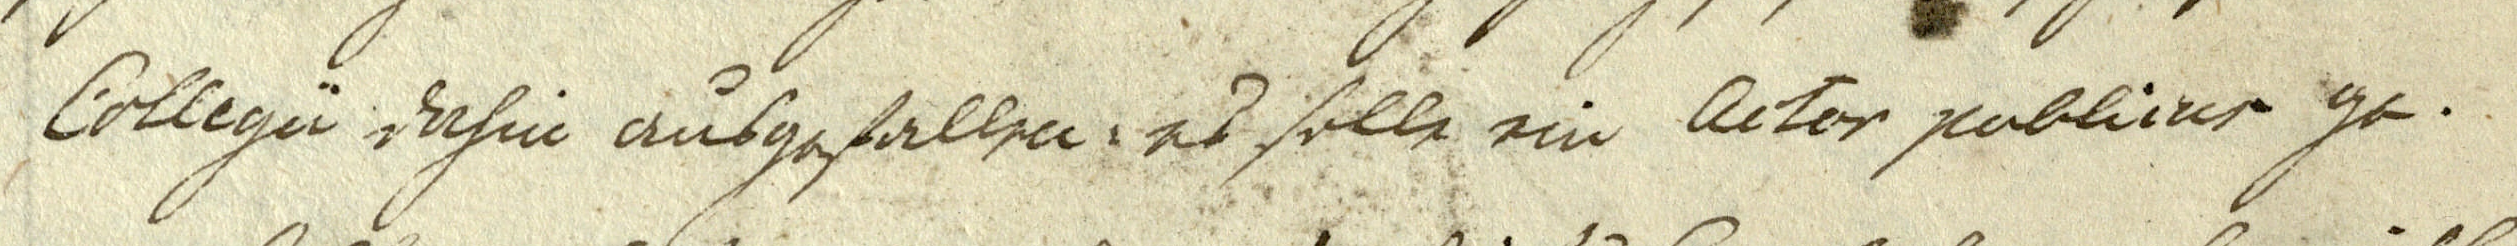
Collegii dahin ausgefallen: es solle ein Actor publicus ge¬
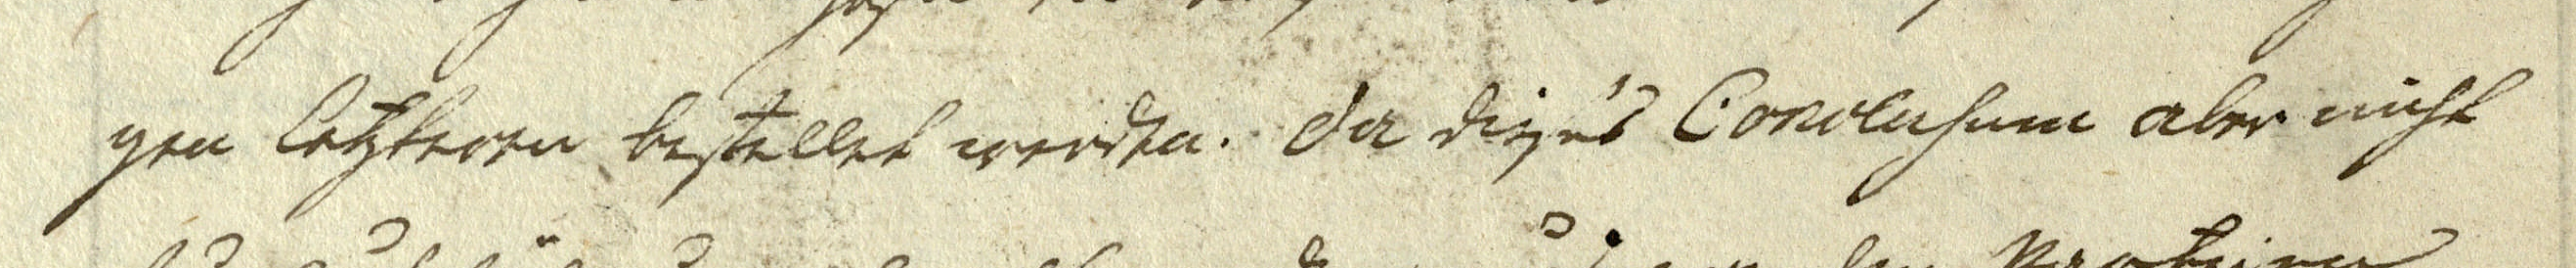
gen letzteren bestellet werden. Da dieses Conclusum aber nicht
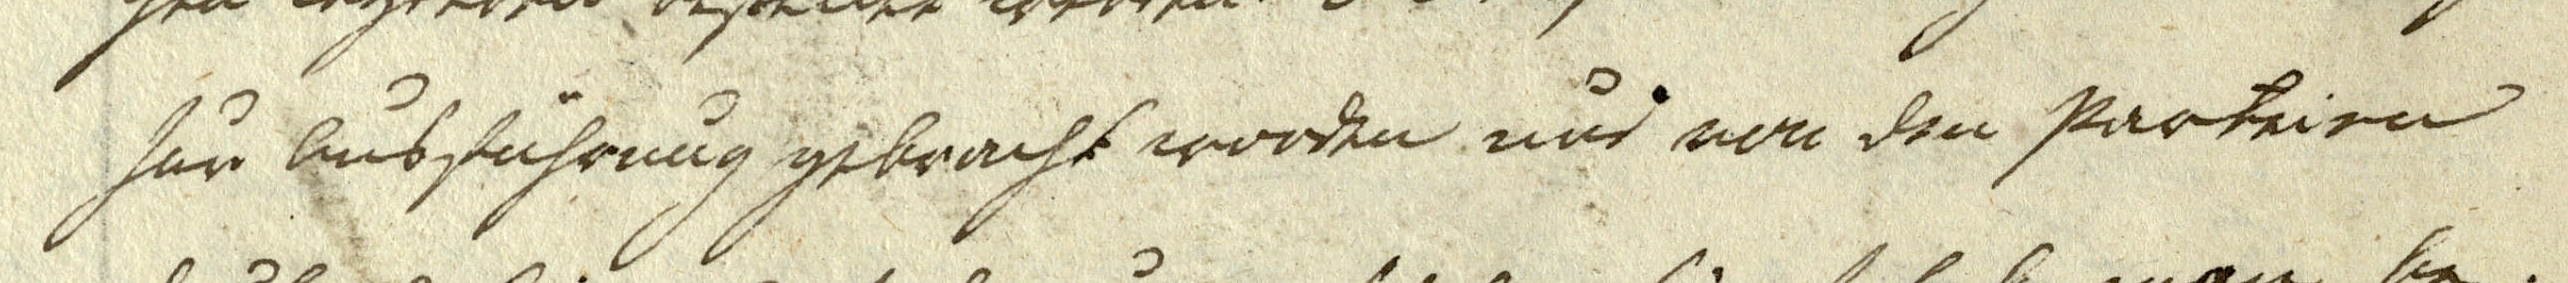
zur Ausführung gebracht worden und von den Parteien
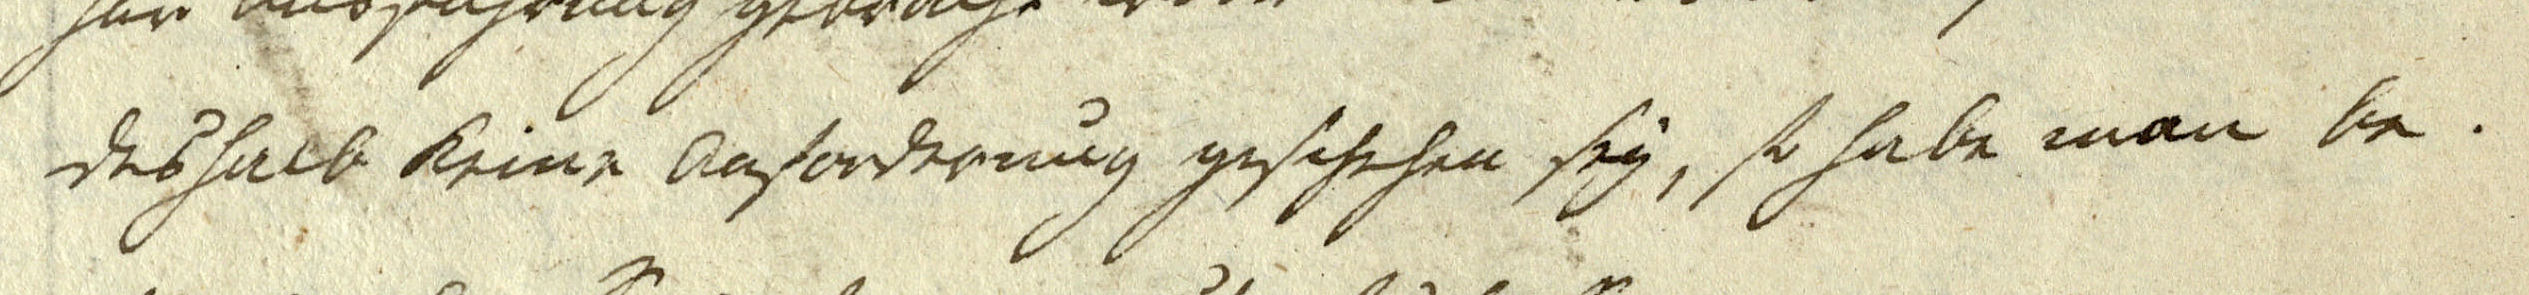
deshalb keine Anforderung geschehen seÿ, so habe man be¬
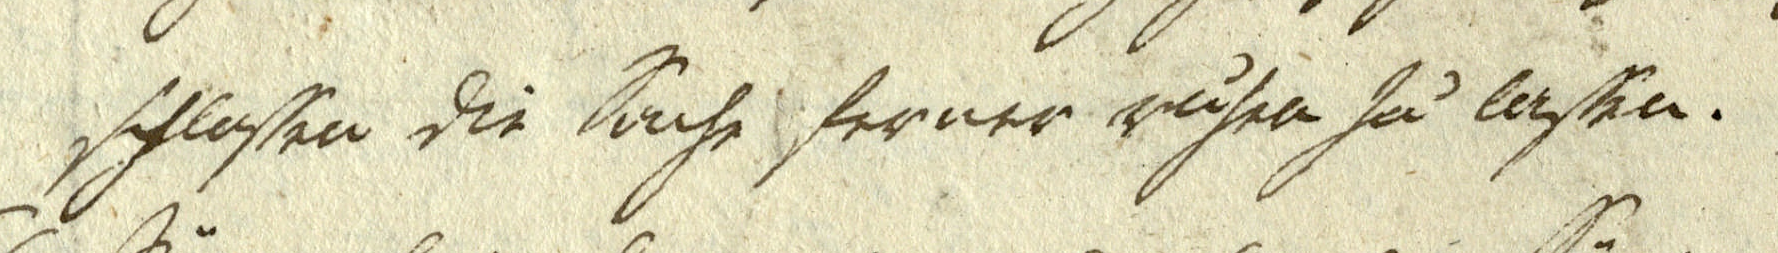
schlossen die Sache ferner ruhen zu lassen.
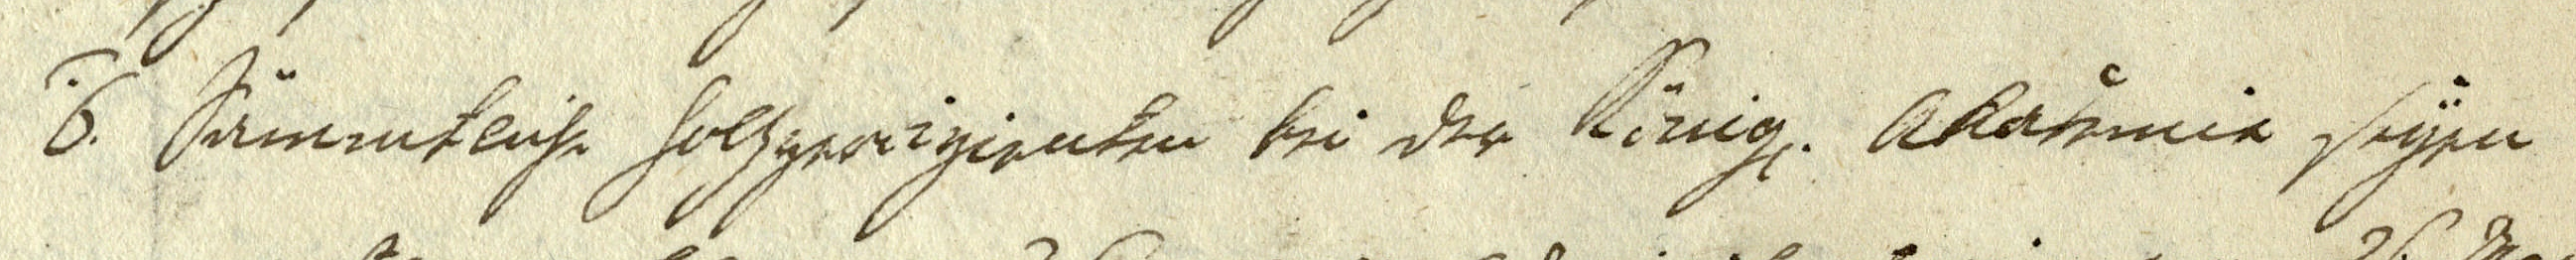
6. Sämmtliche Holzpercipienten bei der Königl. Akademie seÿen
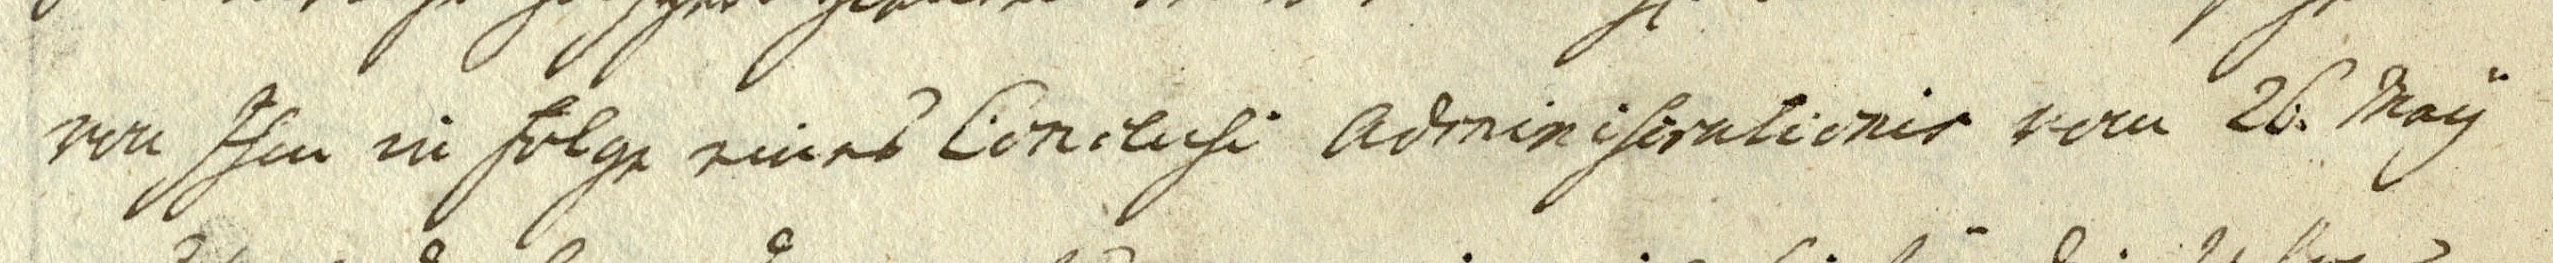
von Ihm in Folge eines Conclusi Administrationis vom 26. Maÿ
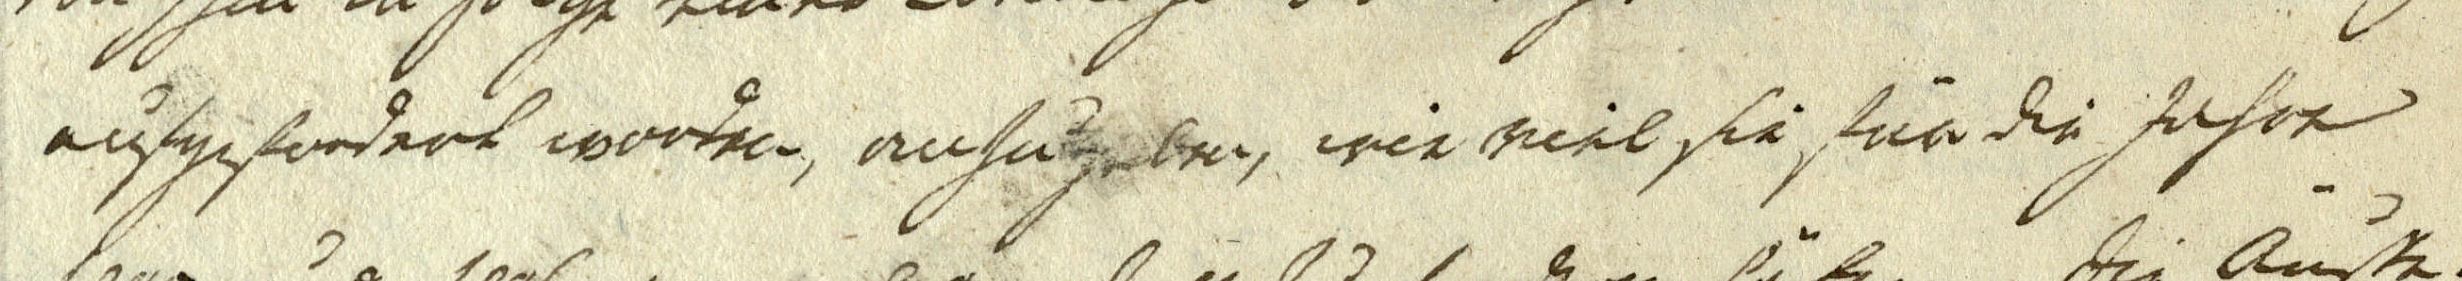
aufgefordert worden, anzugeben, wie viel sie für die Jahre
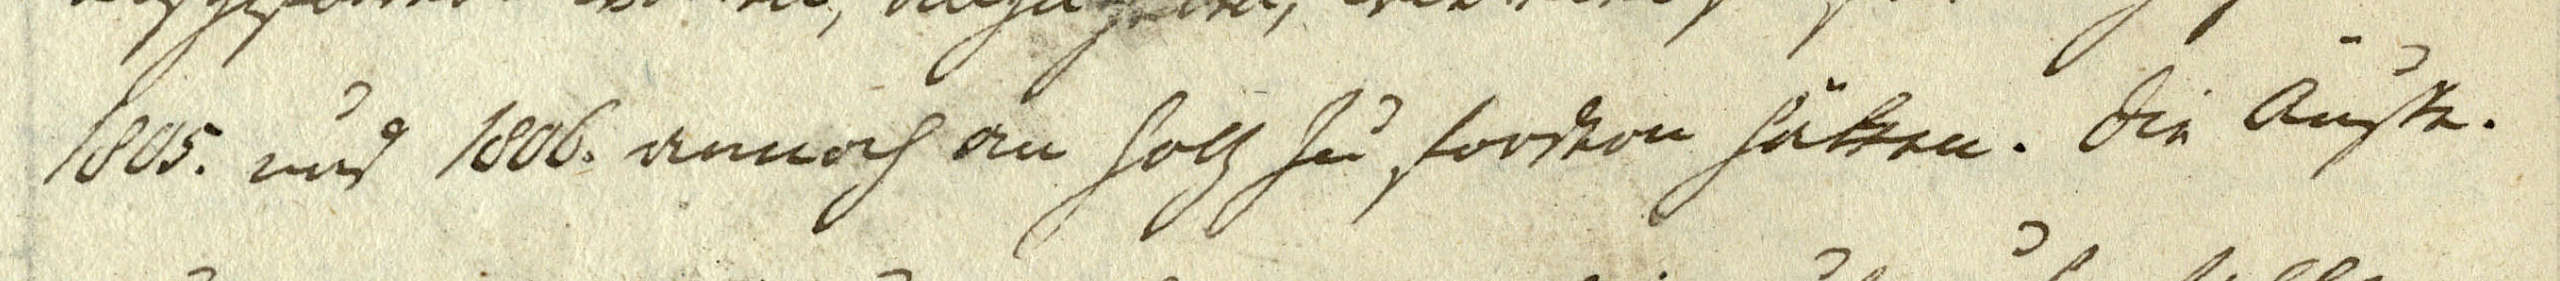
1805. und 1806. annoch an Holz zu fordern hätten. Die Äusse¬
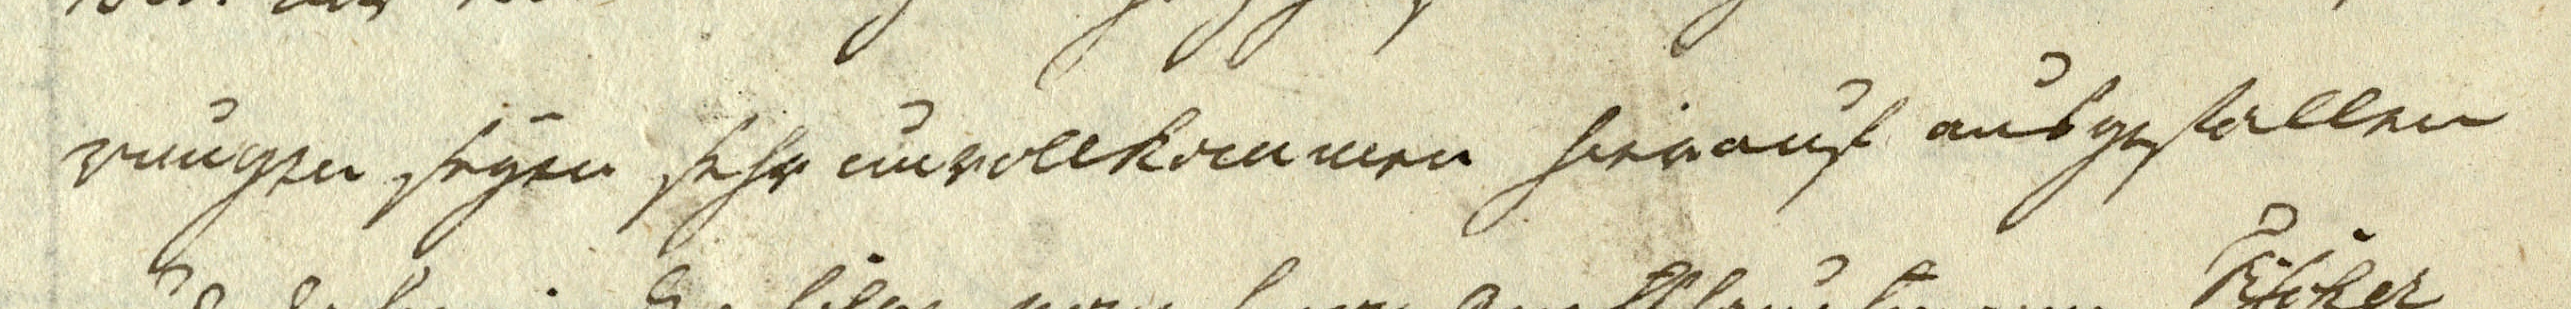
rungen seÿn sehr unvollkommen hierauf ausgefallen
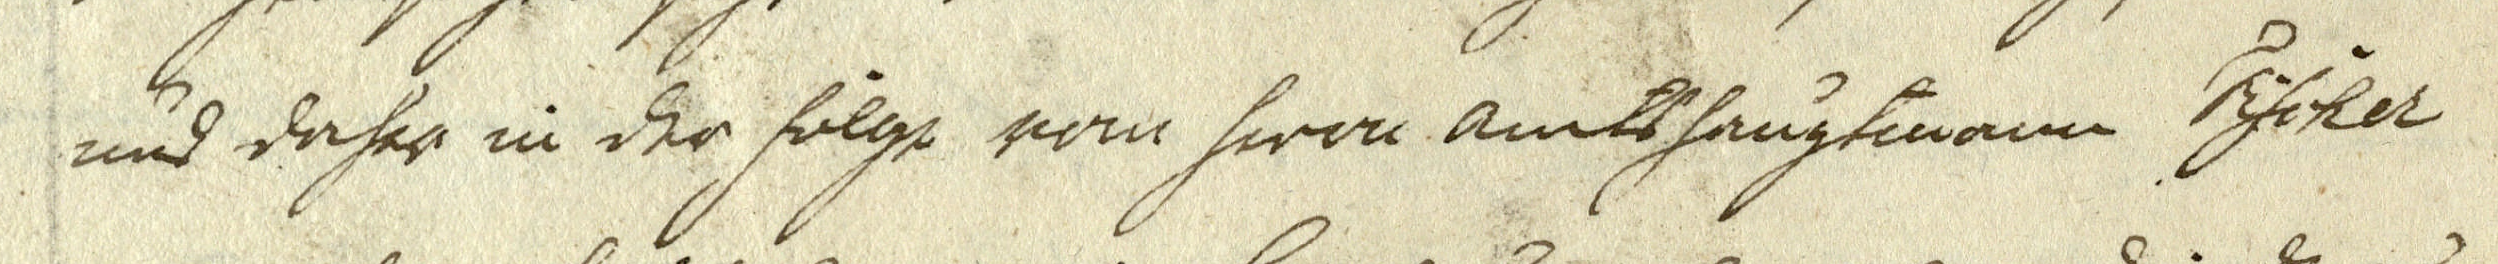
und daher in der Folge vom Herrn Amtshauptmann Fischer
